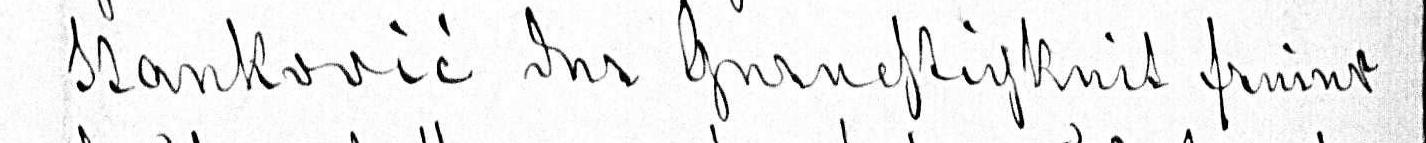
Skanković der Gerechtigkeit seiner
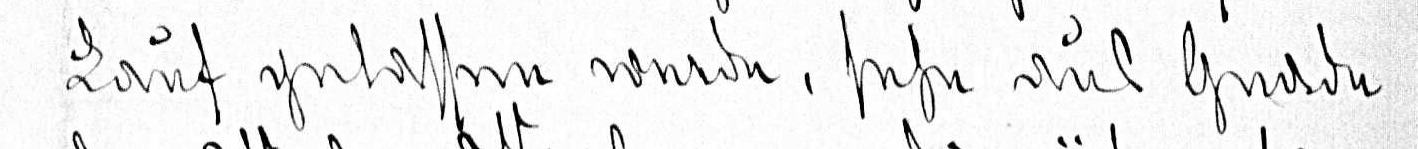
Lauf gelassen werde, sehe aus Gnade
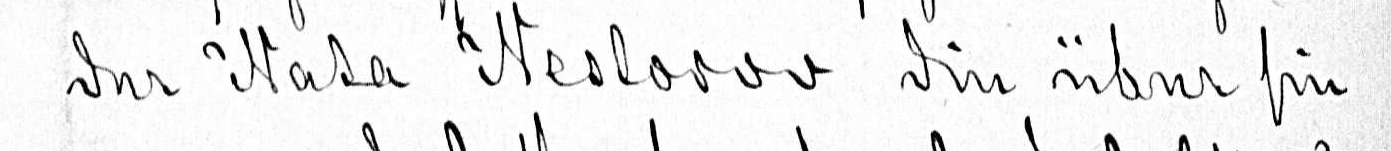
der Nata Nestorov die über sie
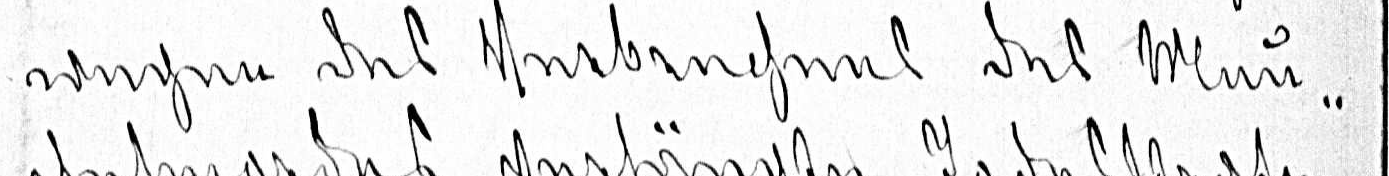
wegen des Verbrechens des Meu¬
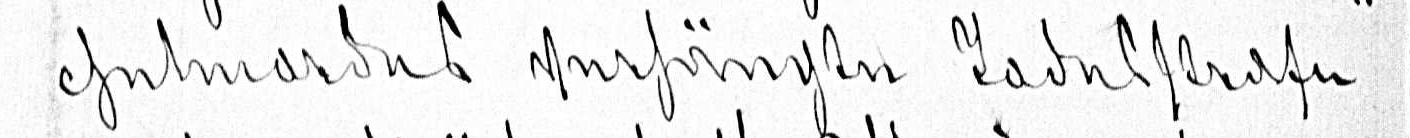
chelmordes verhängte Todesstrafe
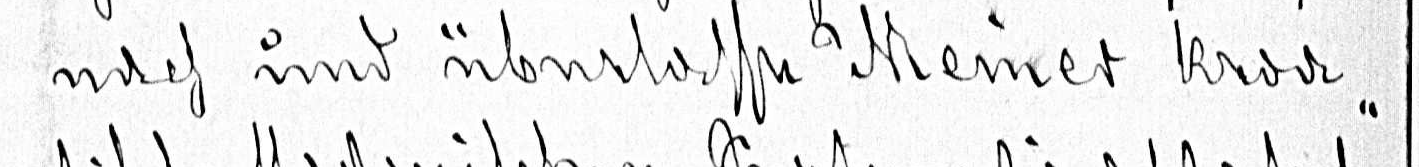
nach und überlasse Meiner kroa¬
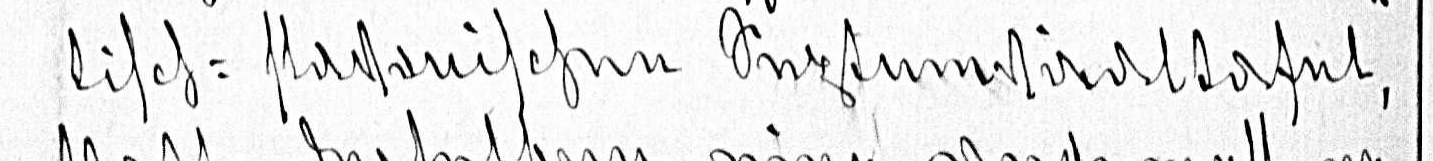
tisch-slavonischen Septemviraltafel,
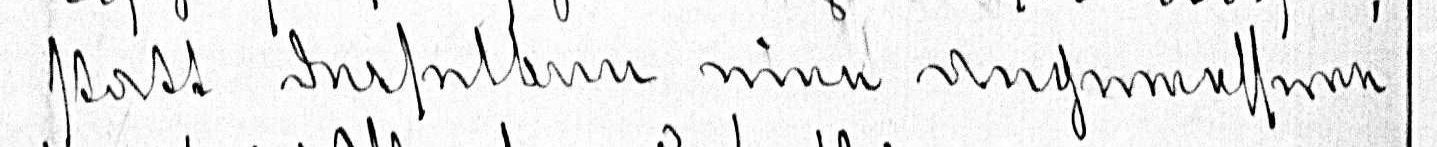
statt desselben eine angemessene
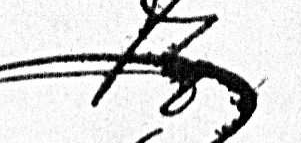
FJ
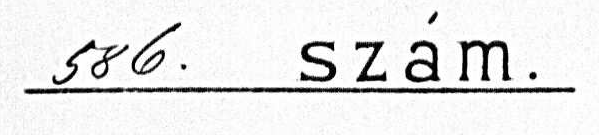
586 szám
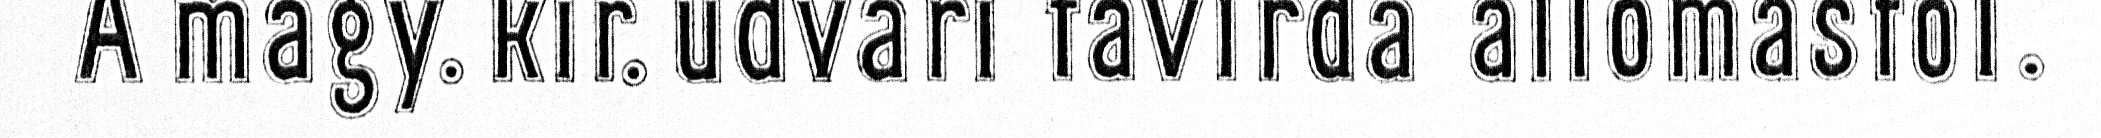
A magy. kir. udvari távirda állomástól.
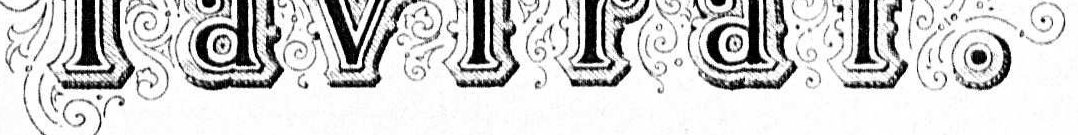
Távirat.
